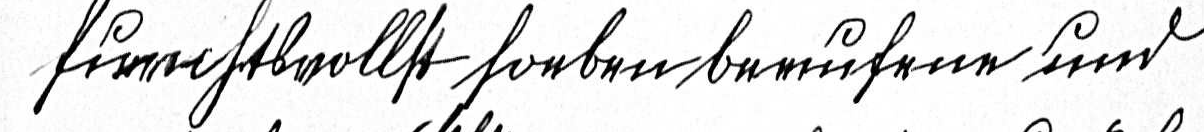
furchtsvollst soeben berufene und
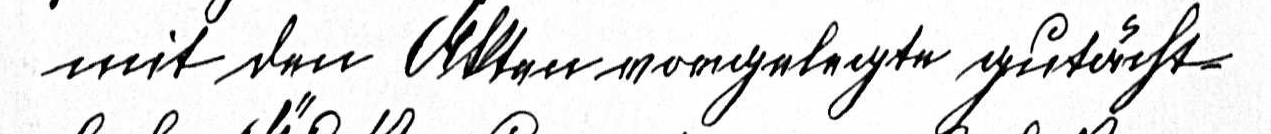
mit den Akten vorgelegte gutächt¬
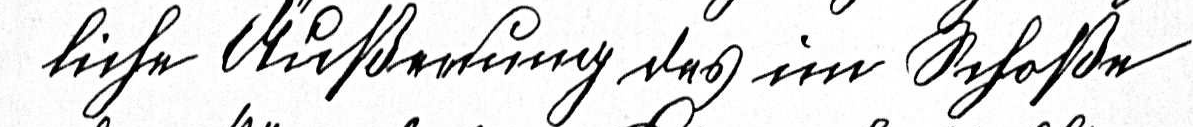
liche Äußerung des im Schoße
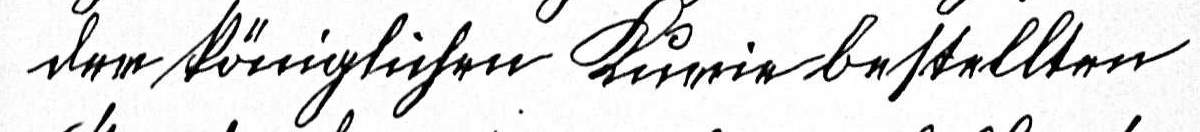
der königlichen Kurie bestellten
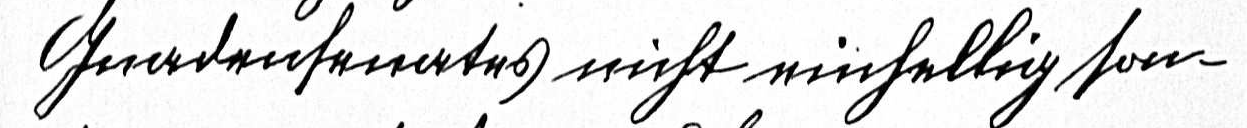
Gnadensenates nicht einhellig son¬
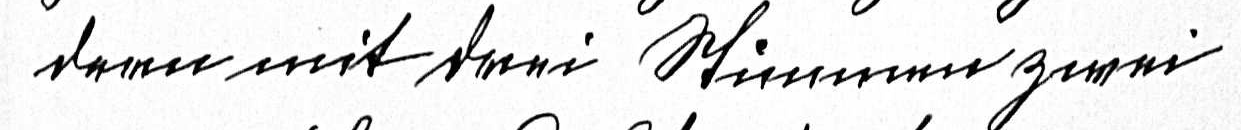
dern mit drei Stimmen zwei
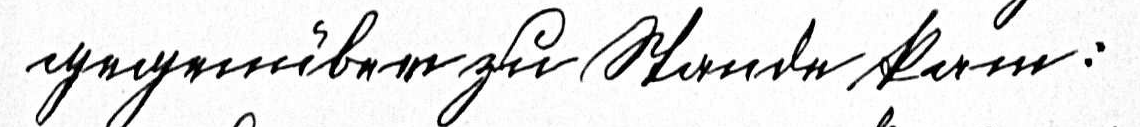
gegenüber zu Stande kam:
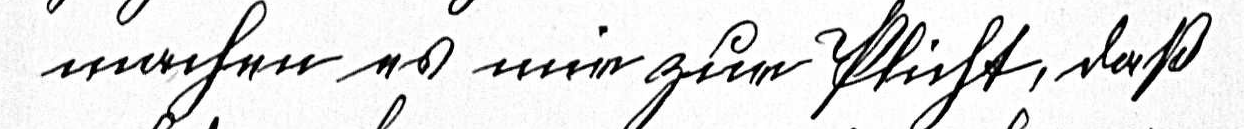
Machen es mir zur Pflicht, daß
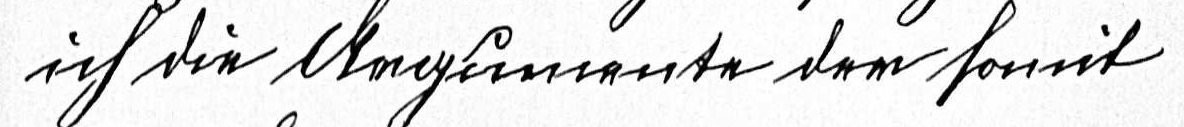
ich die Argumente der somit
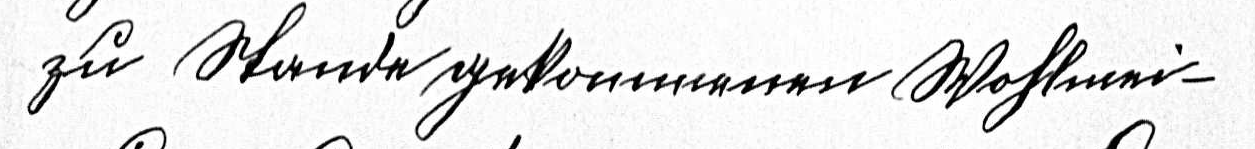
zu Stande gekommenen Wohlmei¬
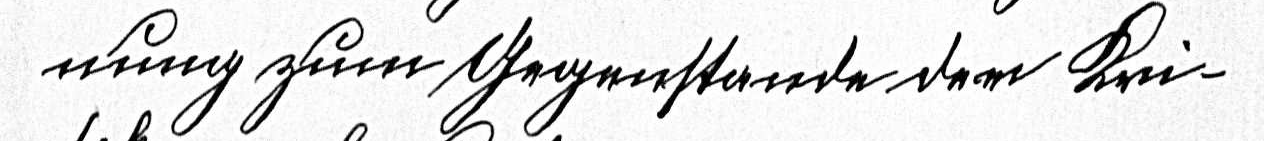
nung zum Gegenstande der Kri¬
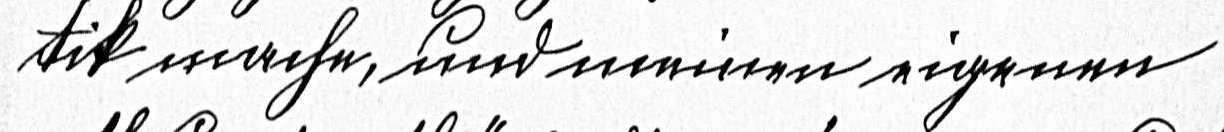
tik mache, und meiner eigenen
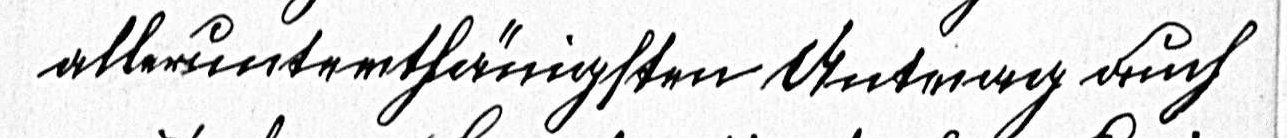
allerunterthänigsten Antrag auch
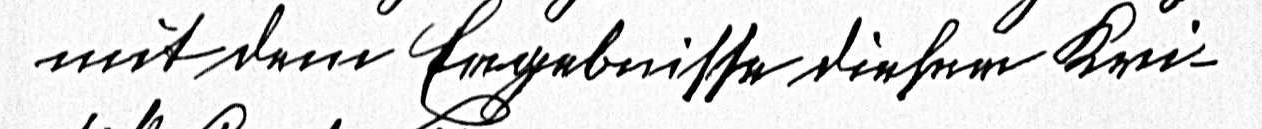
mit dem Ergebnisse dieser Kri¬
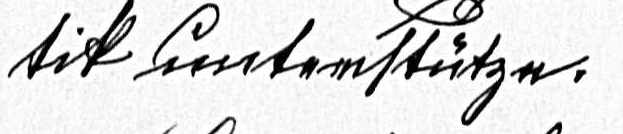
tik unterstütze.
